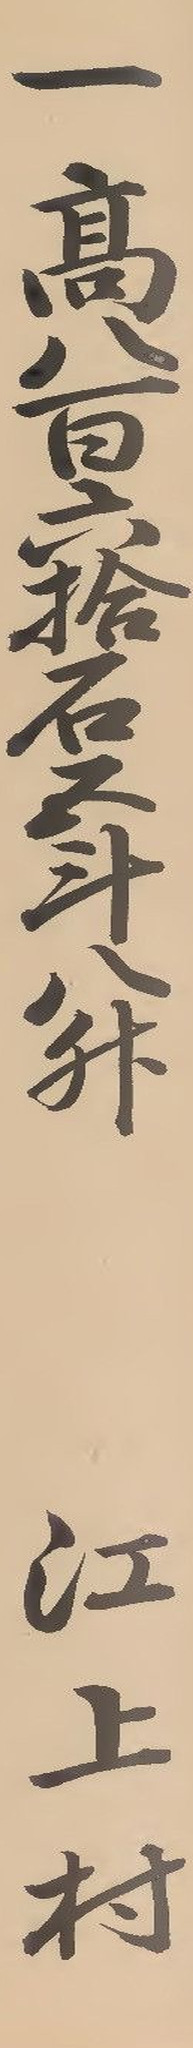一高八百六拾石五斗八升江上村
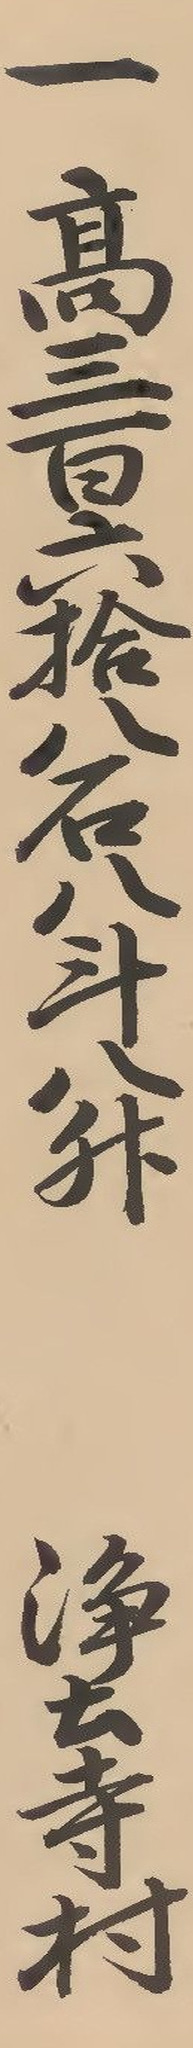一高三百六拾八石八斗八升浄土寺村
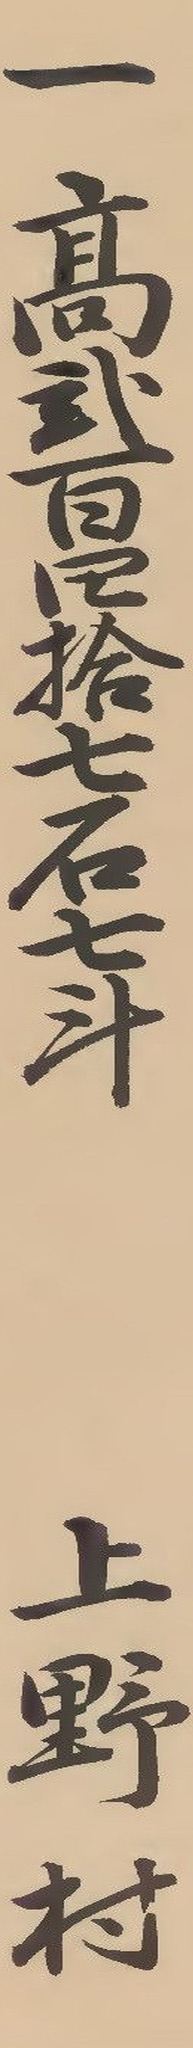一高弐百四拾七石七斗上野村
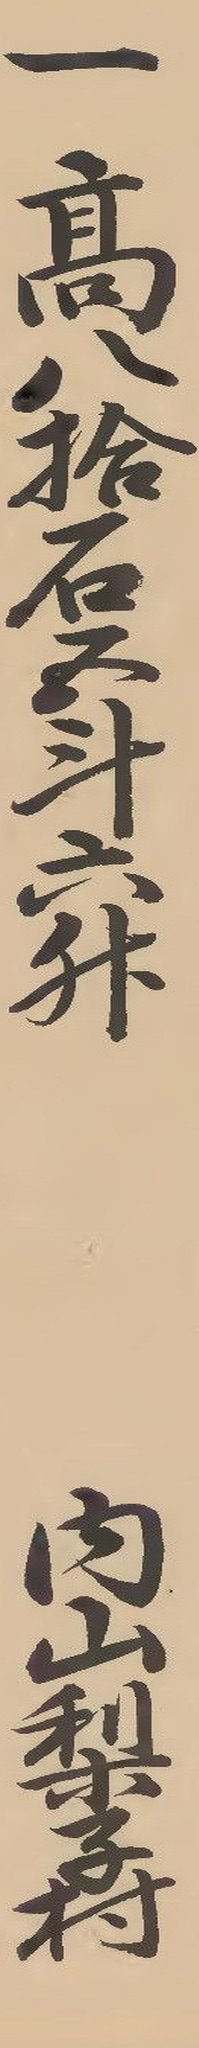一高八拾石五斗六升内山梨子村

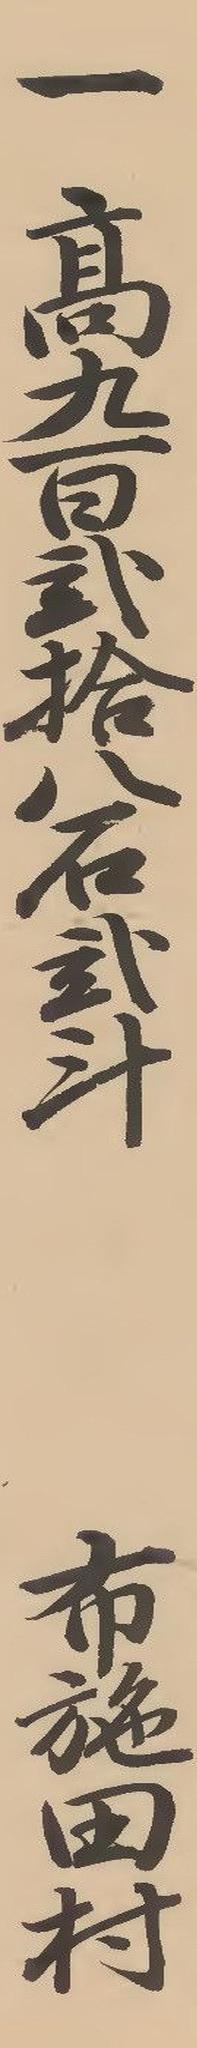一高九百弐拾八石弐斗布施田村
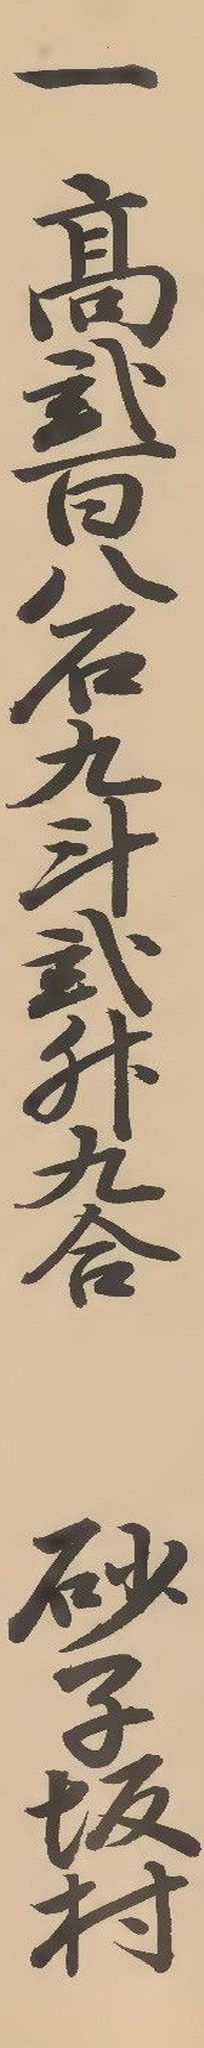一高弐百八石九斗弐升九合砂子坂村
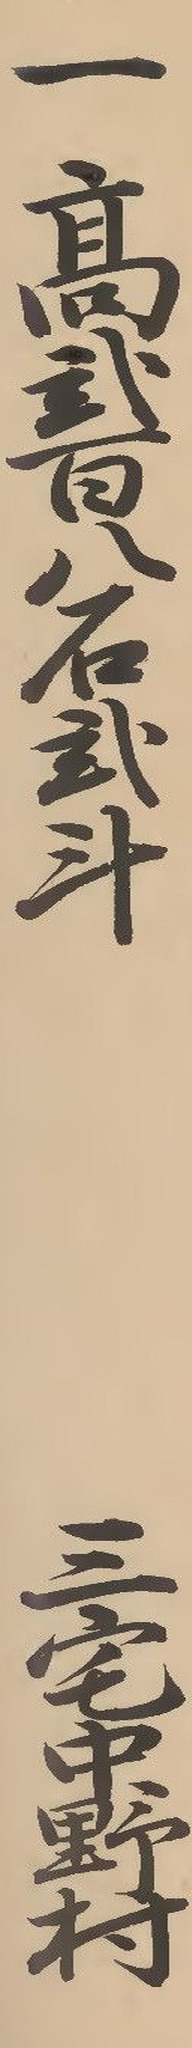一高弐百八石弐斗三宅中野村
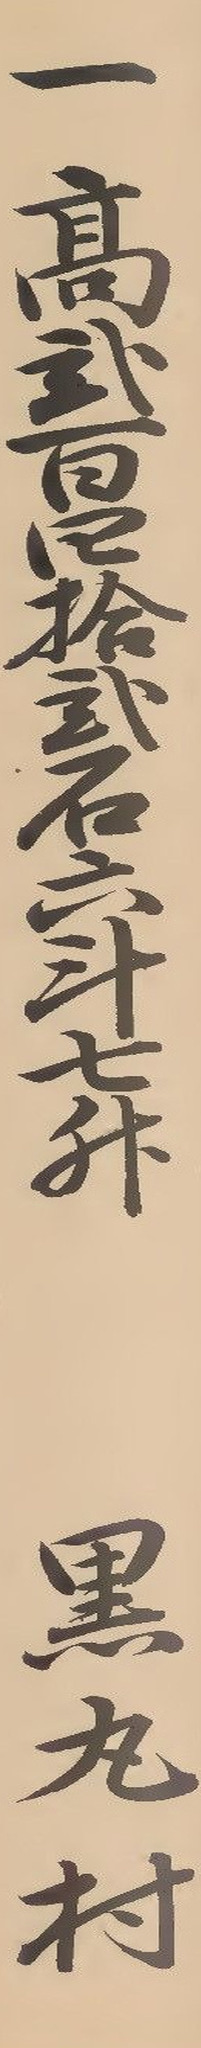一高弐百四拾弐石六斗七升黒丸村
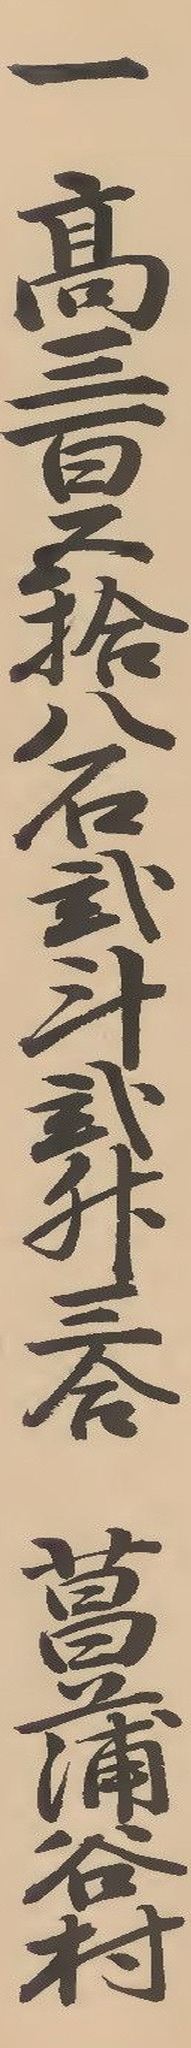一高三百五拾八石弐斗弐升三合菖蒲谷村
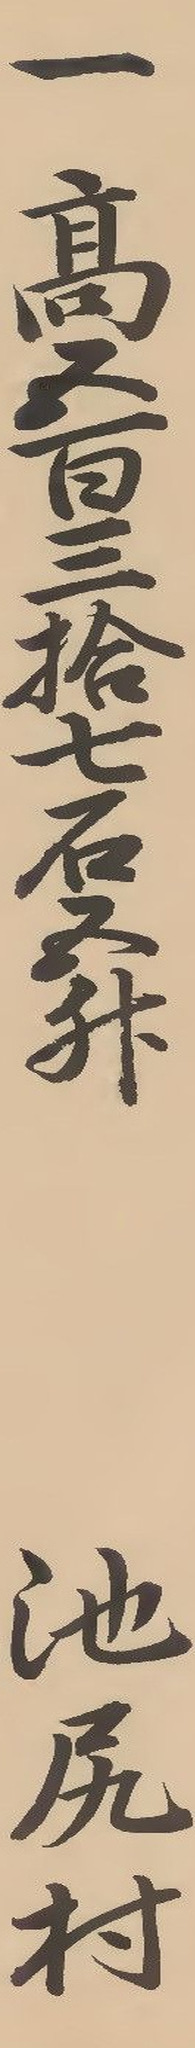一高五百三拾七石五升池尻村
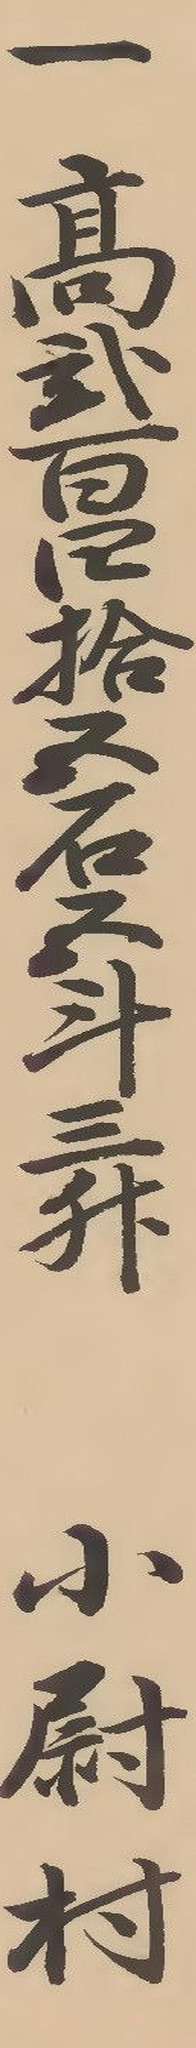一高弐百四拾五石五斗三升小尉村

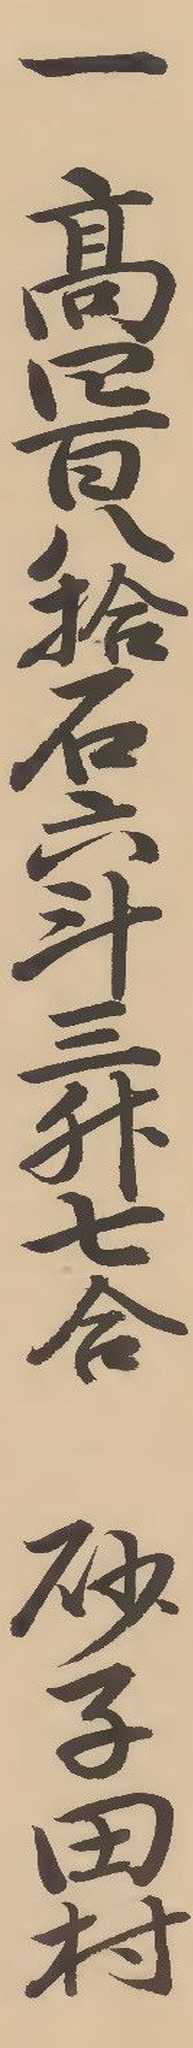一高四百八拾石六斗三升七合砂子田村
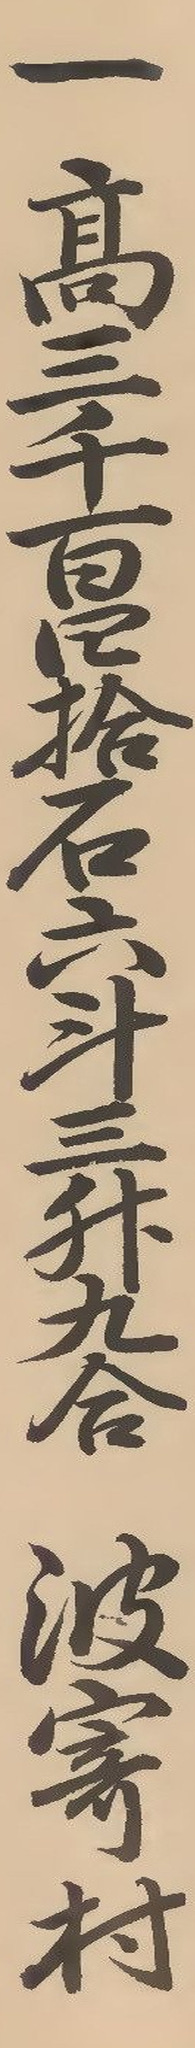一高三千百四拾石六斗三升九合波寄村
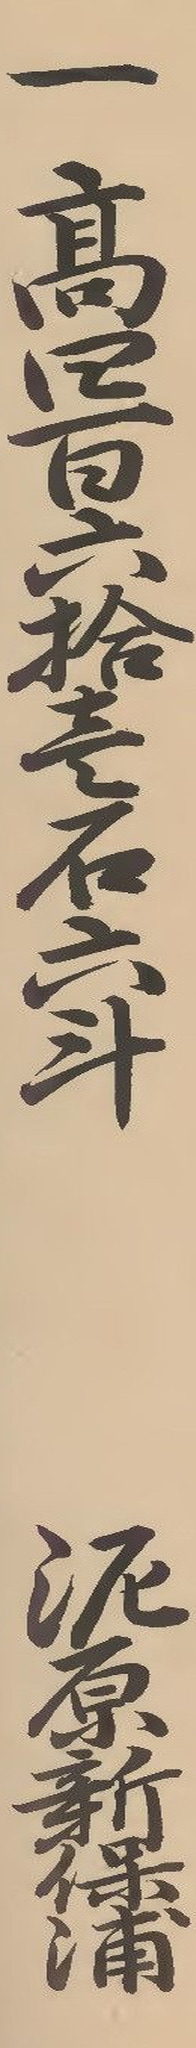一高四百六拾壱石六斗泥原新保浦
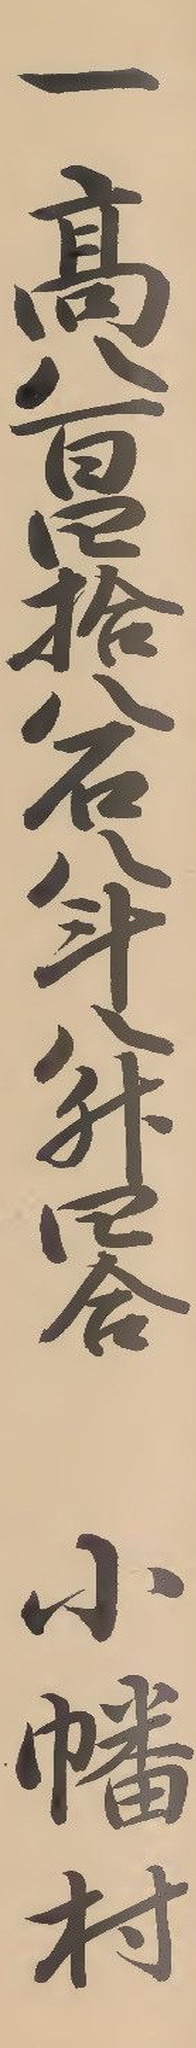一高八百四拾八石八斗八升四合小幡村
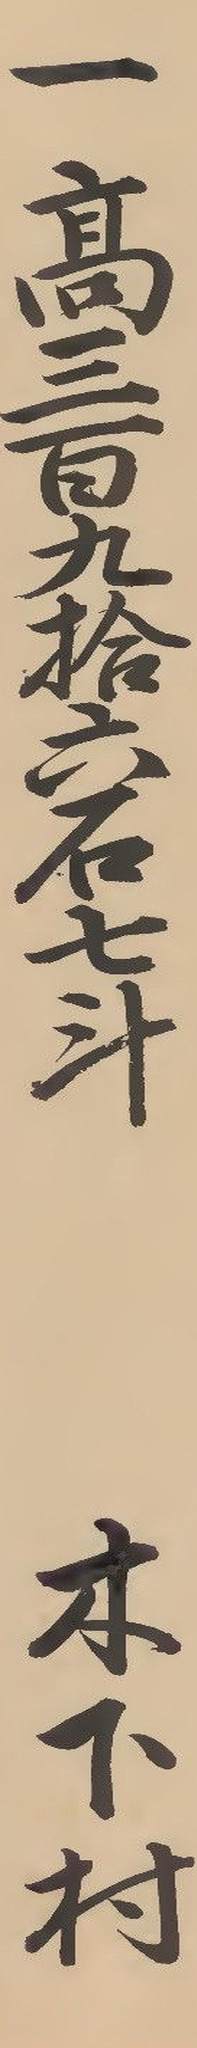一高三百九拾六石七斗木下村
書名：越前国郷帳
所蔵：国立公文書館 National Archives of Japan
